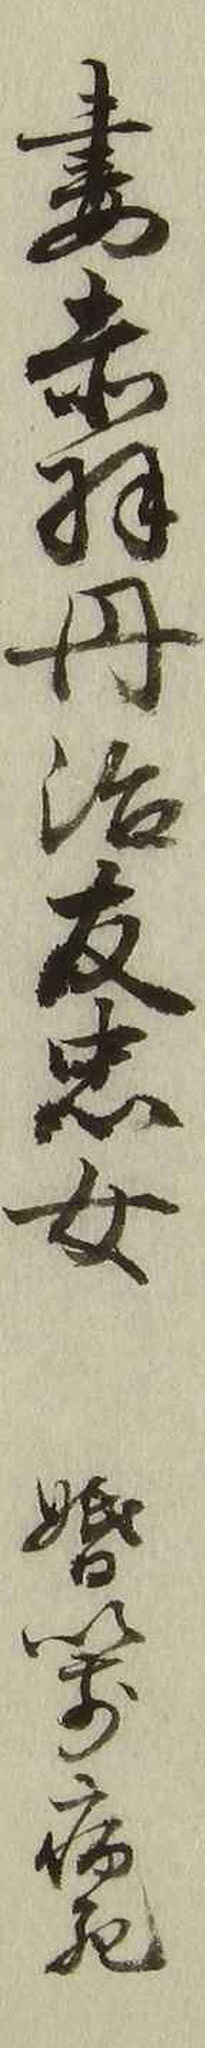妻赤羽丹治友忠女婚以前病死
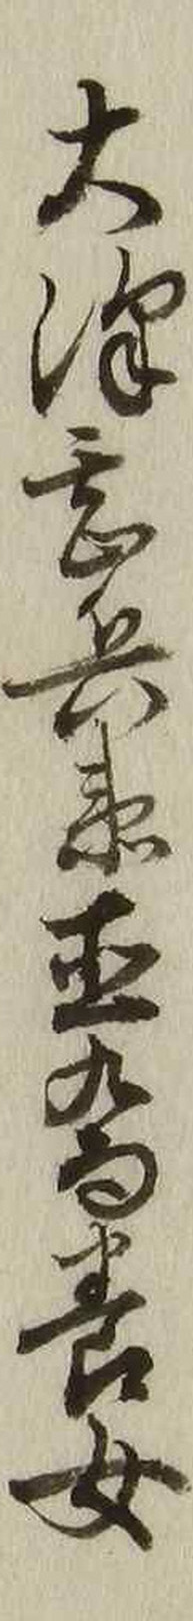大沢甚兵衛直喬養女
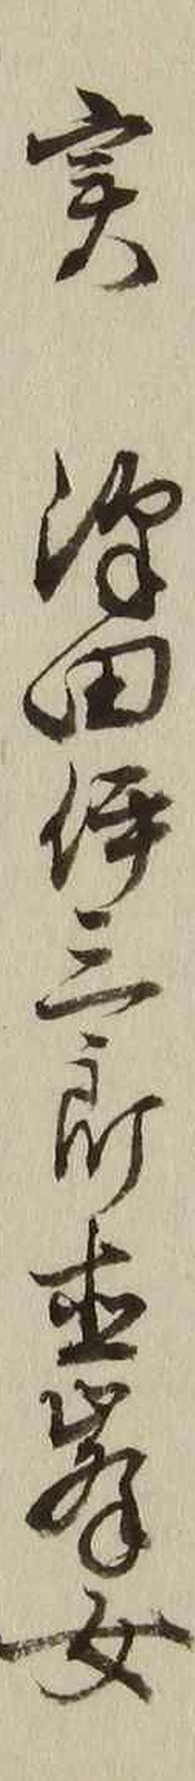実沢田伊三郎直峰女
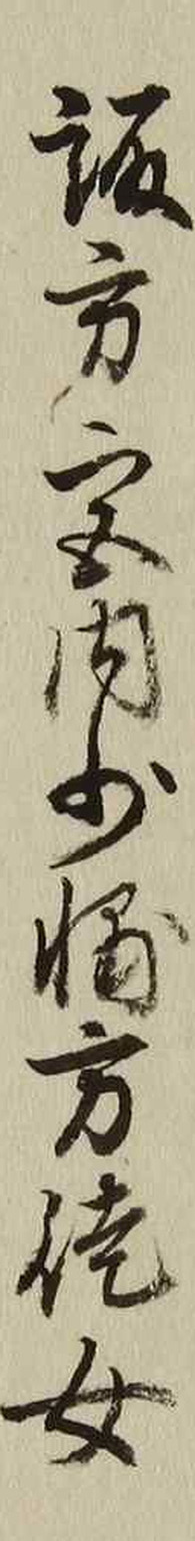諏方宮内少輔方徒女
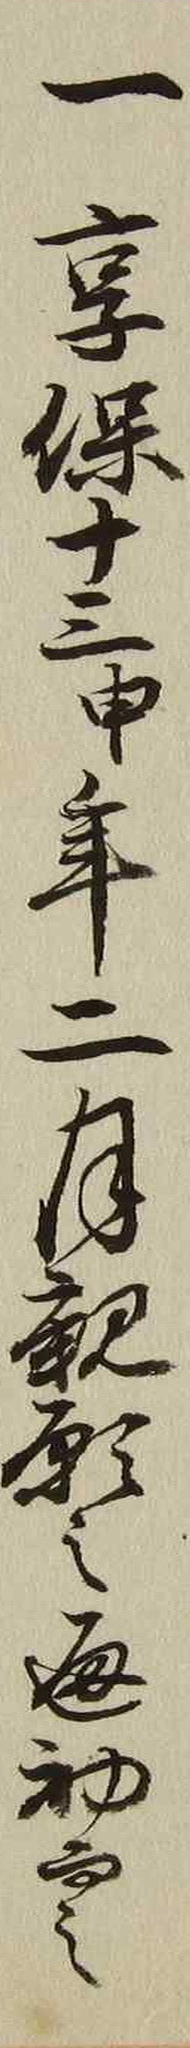一享保十三申年二月親願之通初而之
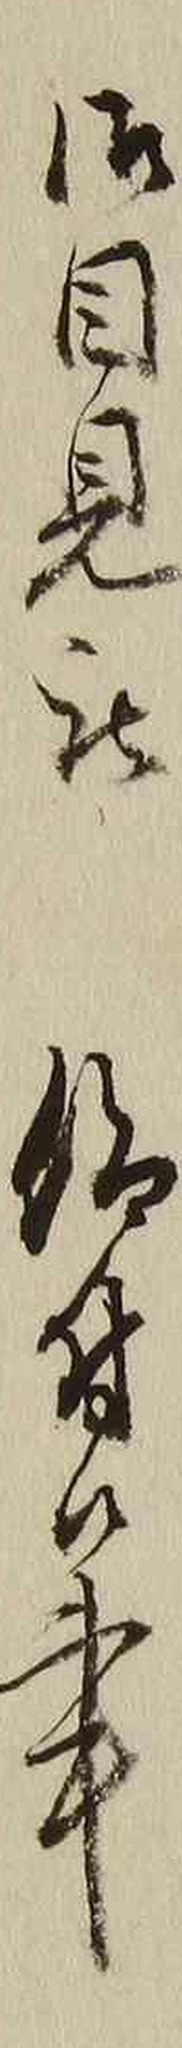御目見被仰付候事
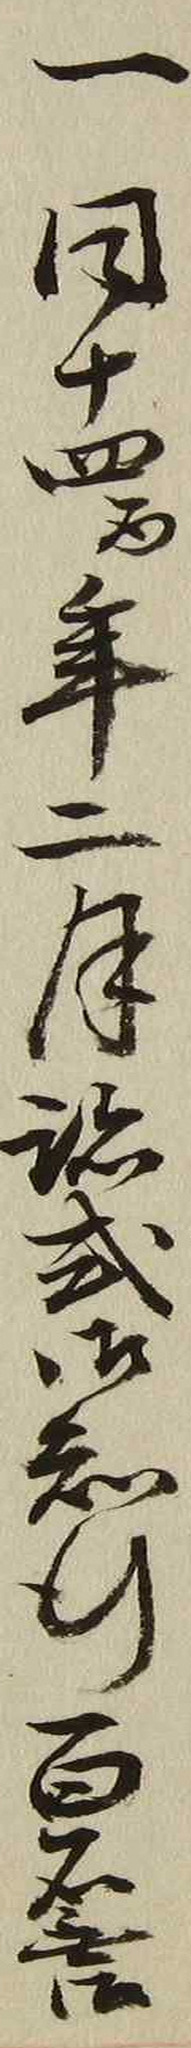一同十四酉年二月跡式御知行百石無御
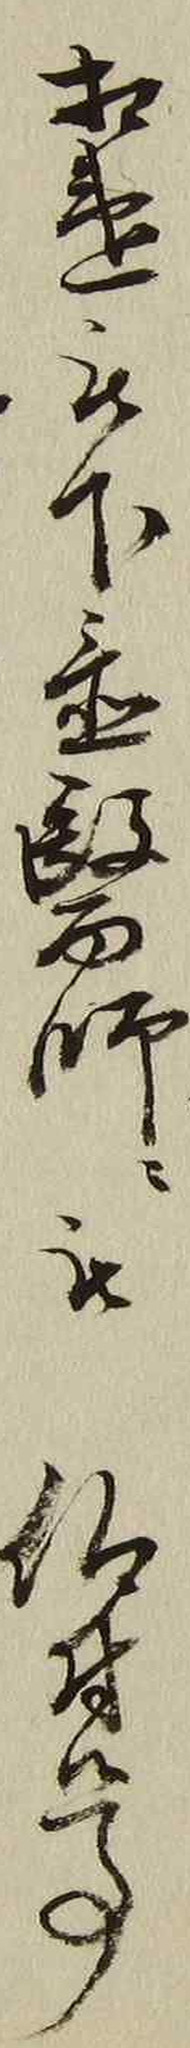相違被下置医師ニ被仰付候事
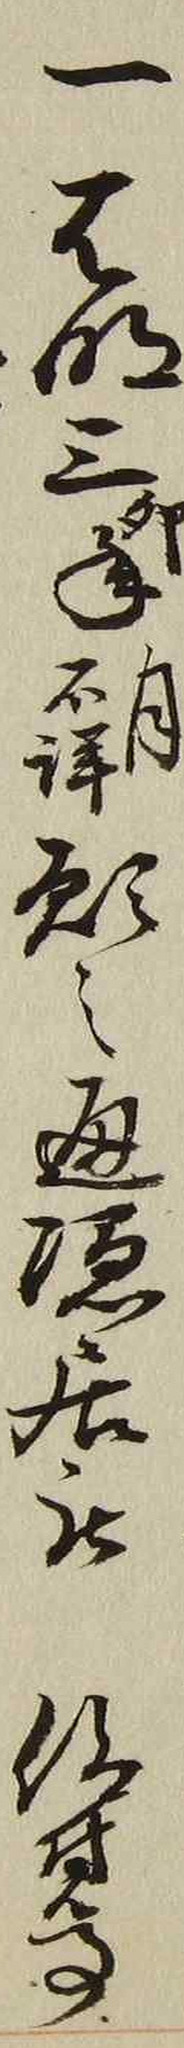一天明三卯年月不詳願之通隠居被仰付候事
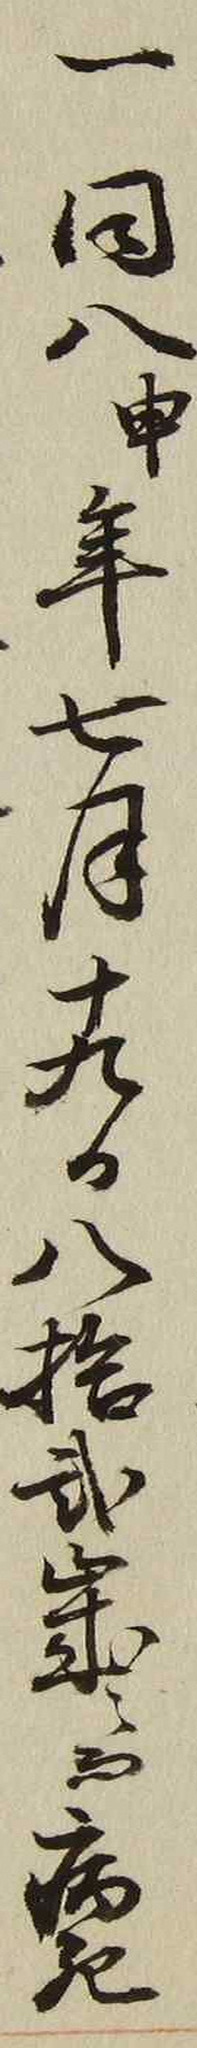一同八申年七月十九日八拾弐歳ニ而病死
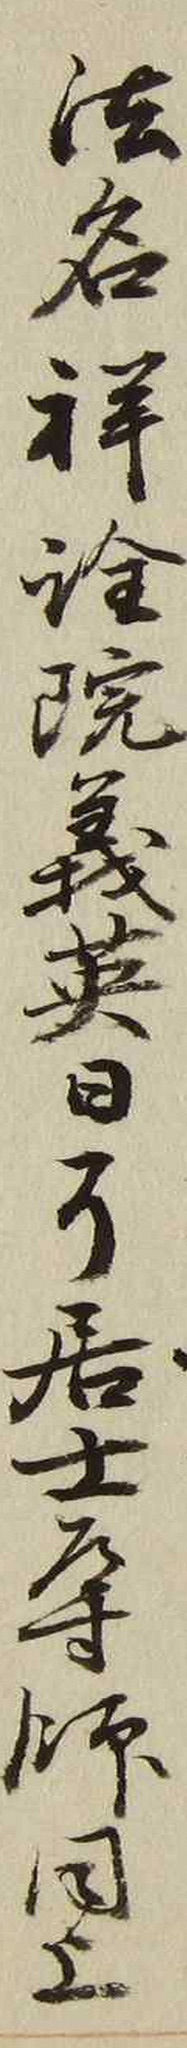法名祥詮院義英日了居士導師同上
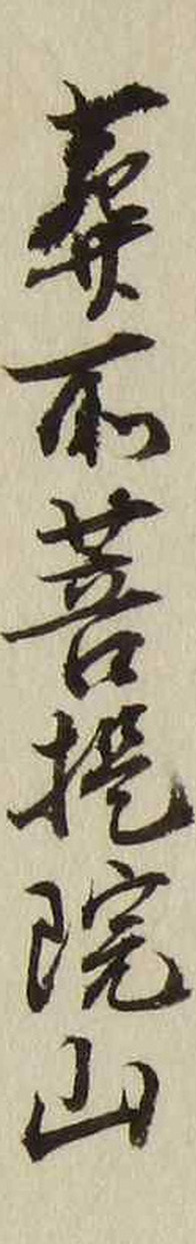葬所菩提院山

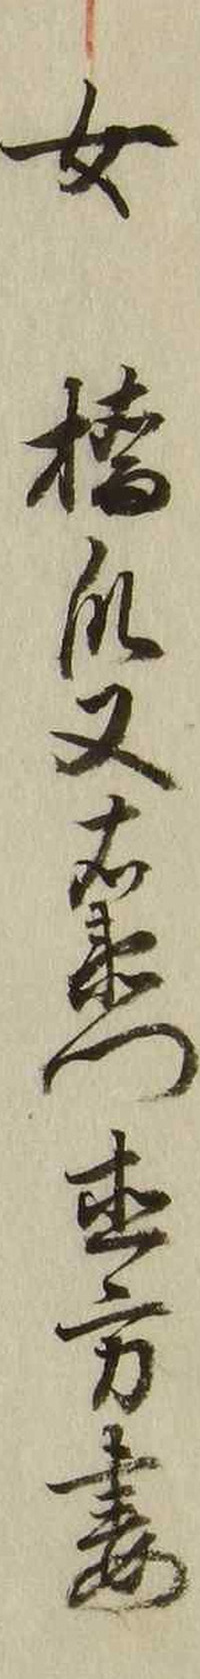女橋爪又右衛門直方妻
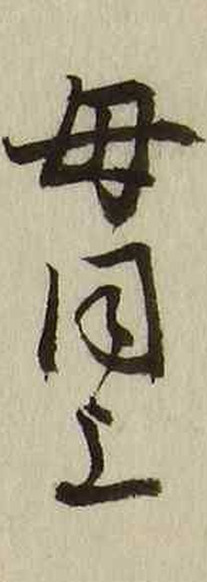母同上
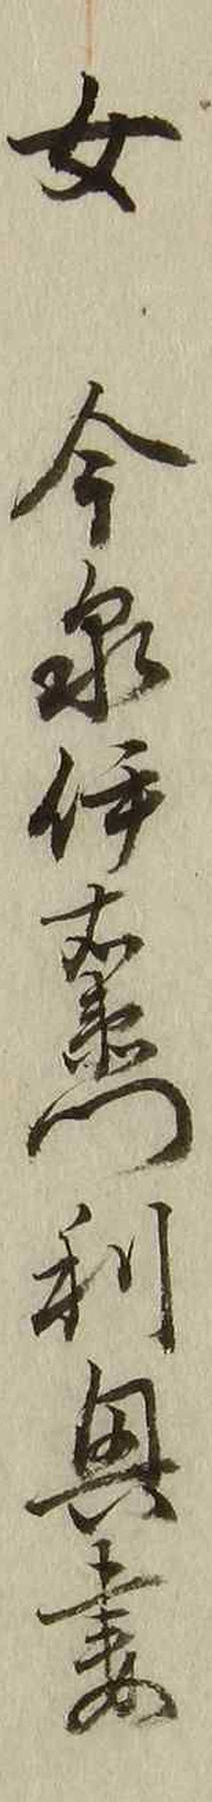女今泉伊右衛門利興妻
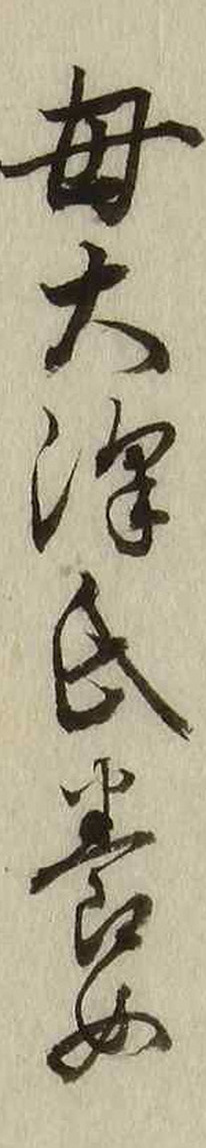母大沢氏養女
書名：諸士系譜　巻之39　は之部7
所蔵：会津若松市立会津図書館
